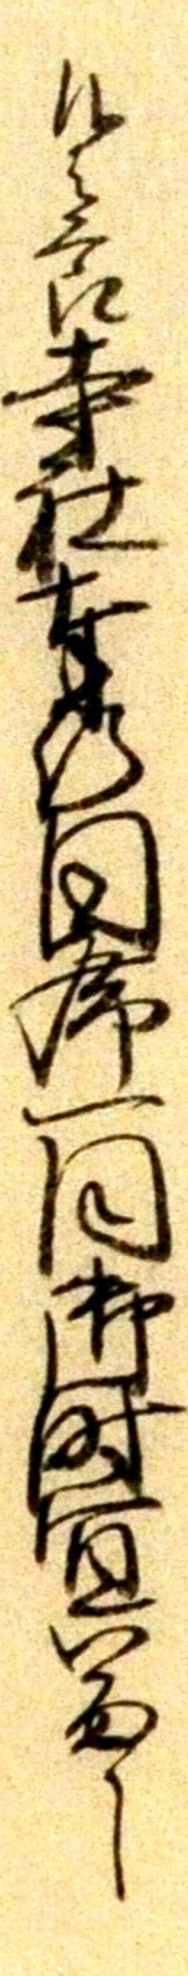候之節寺社奉行同席一同御時宜いたし
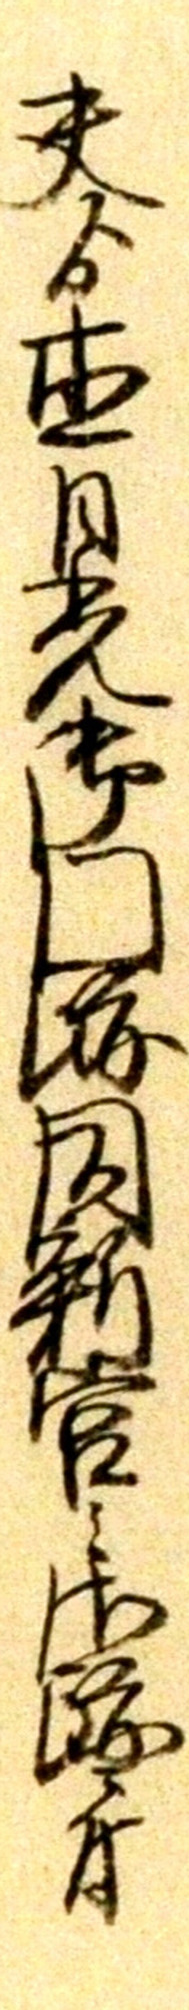夫ゟ直日光御門跡同新官之御跡ニ付
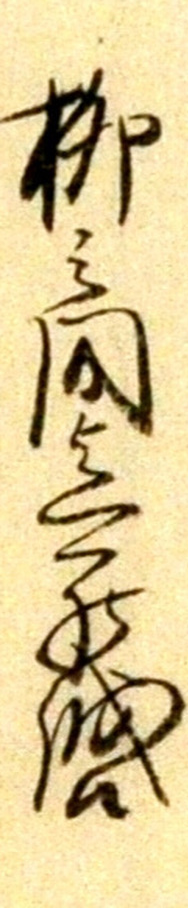柳之間迄罷越候
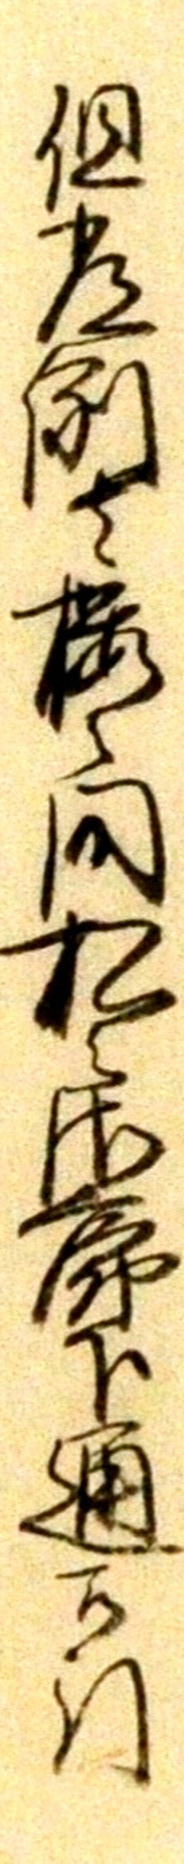但常例は桜之間松之御廊下通被引
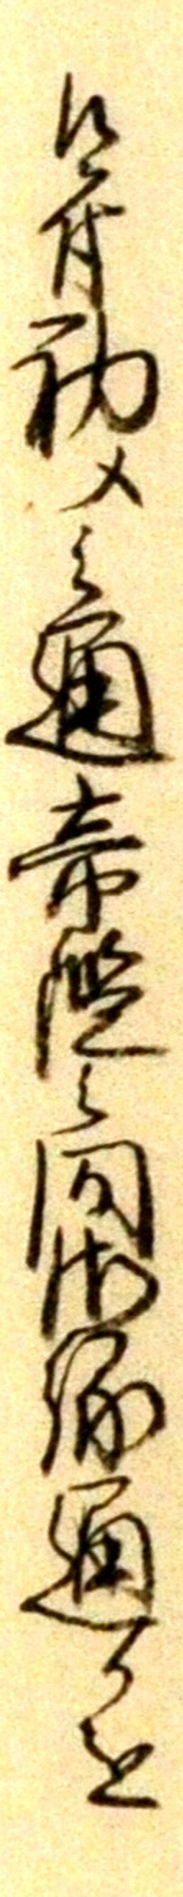候ニ付初メ之通帝鑑之間御縁頬通りを

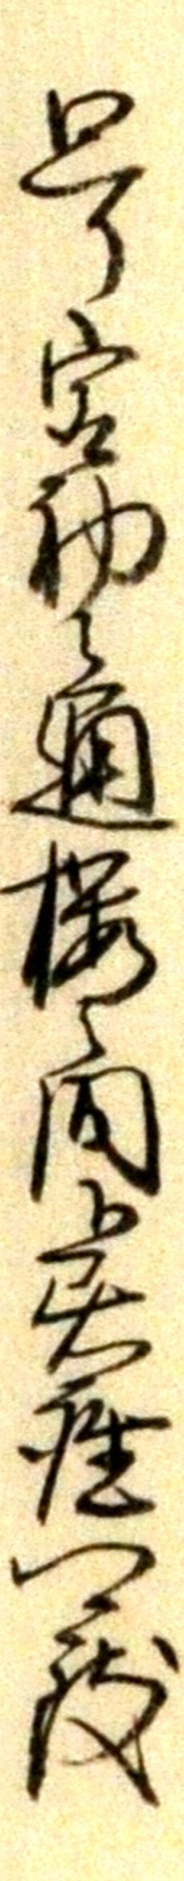廻り最初之通桜之間え着座可致
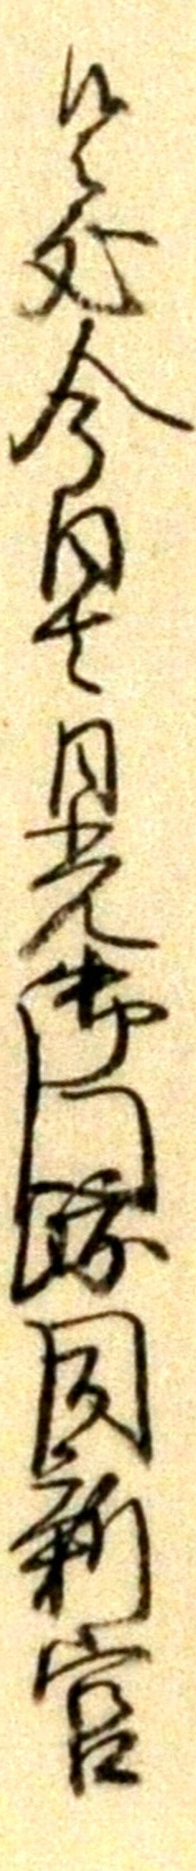候之処今日は日光御門跡同新官
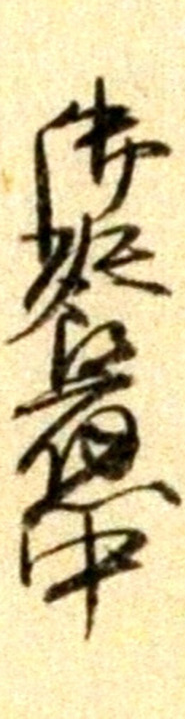御饗応中
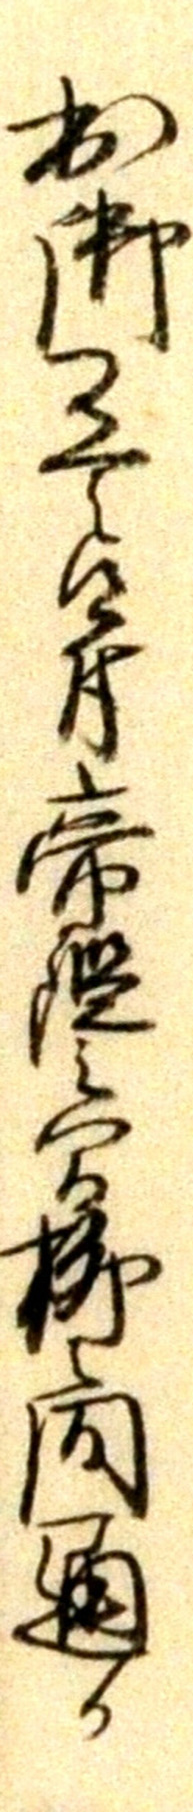出御有之候付帝鑑之間柳之間通り
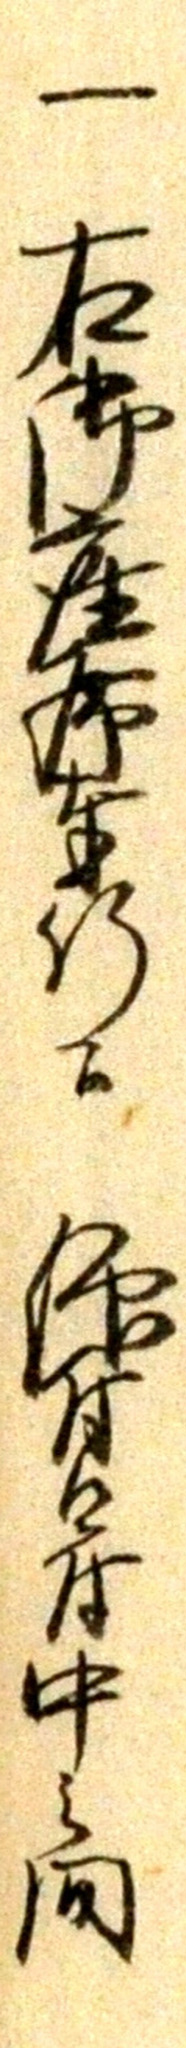一右御座席奉行被仰付候ニ付中之間
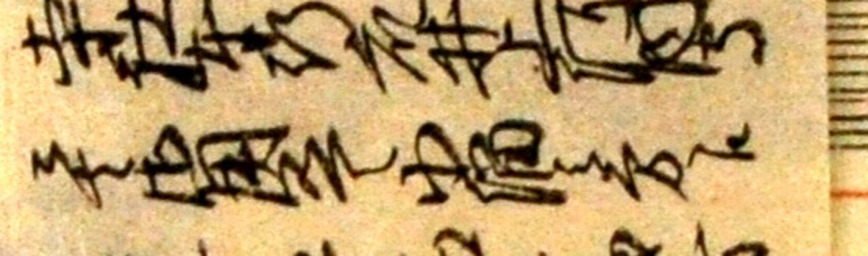ニは御用有之小溜之方え
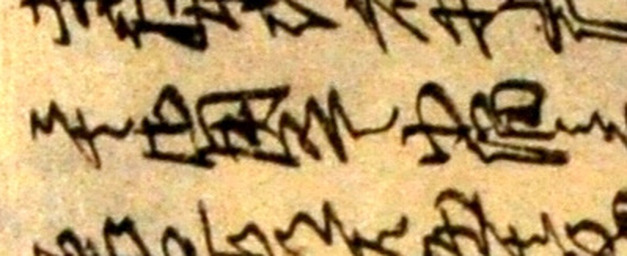ニは御用有之小溜之方え
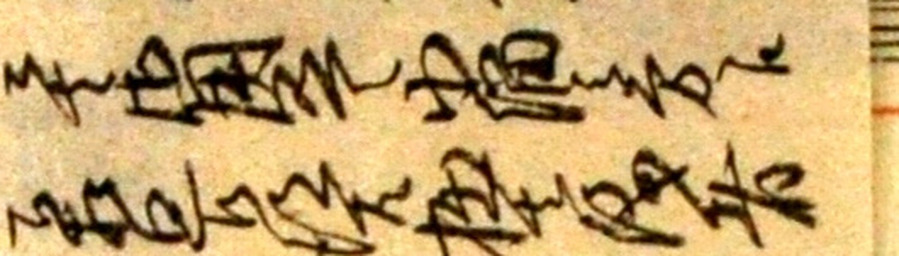ニは御用有之小溜之方え
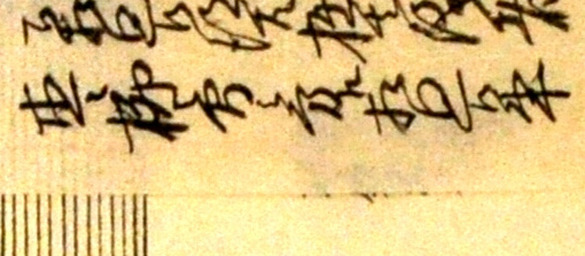直ニ柳之間之方え相廻候事
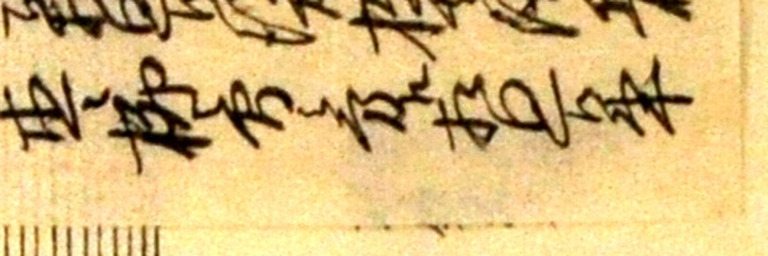直ニ柳之間之方え相廻候事
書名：御移徒相済御祝儀御能ノ節ノ留外
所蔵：伊那市立高遠町図書館・合同会社AMANE
